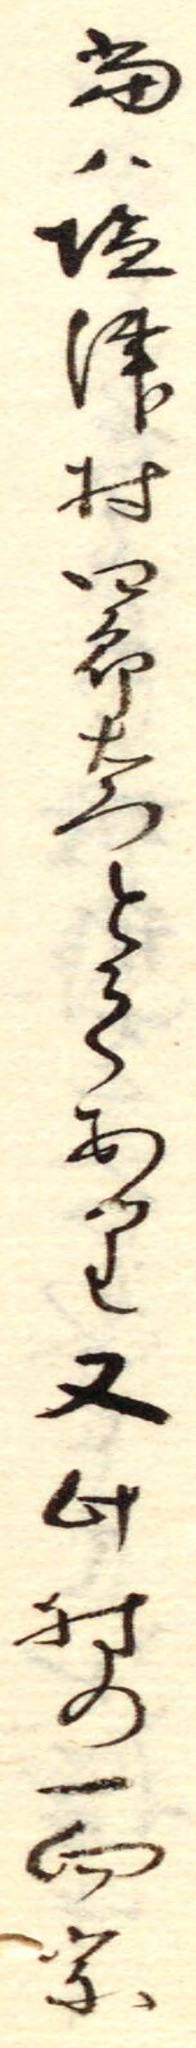当は塩津村四郎右衛門とてあり又此村の一向宗
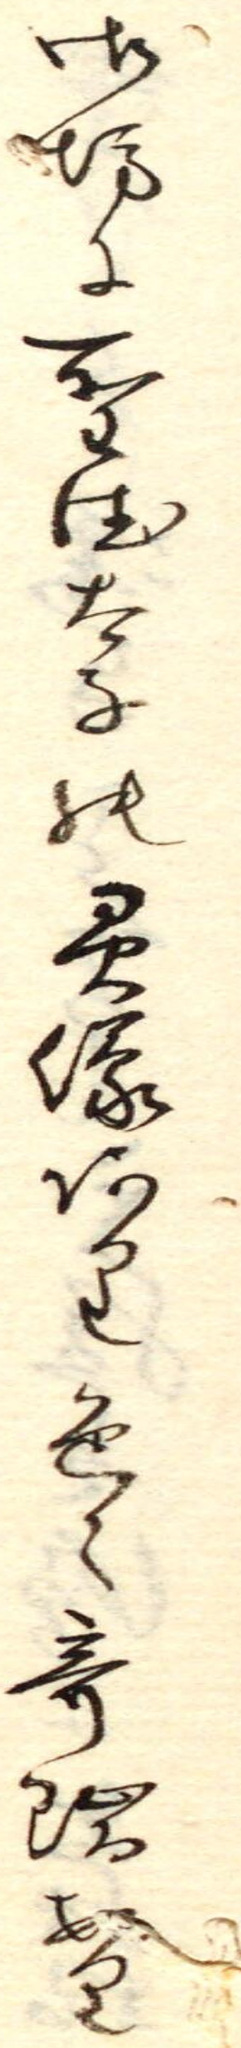御坊に聖徳太子の霊像あり色々奇瑞あり
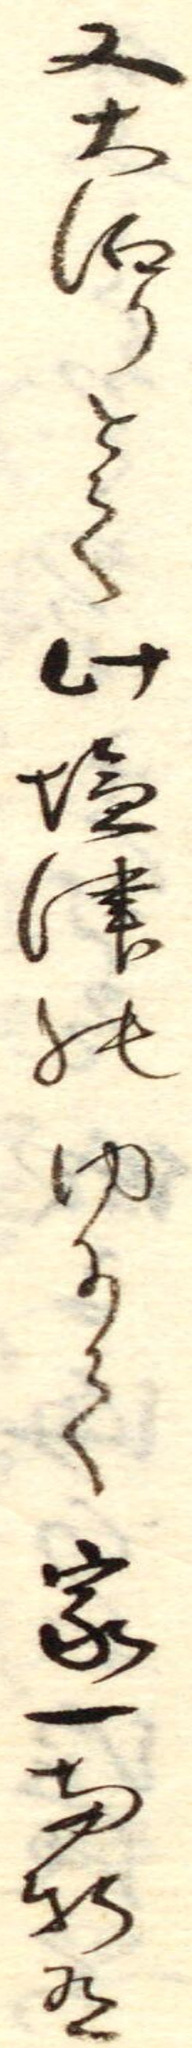又大泊りとて此塩津の内にて家一両軒有
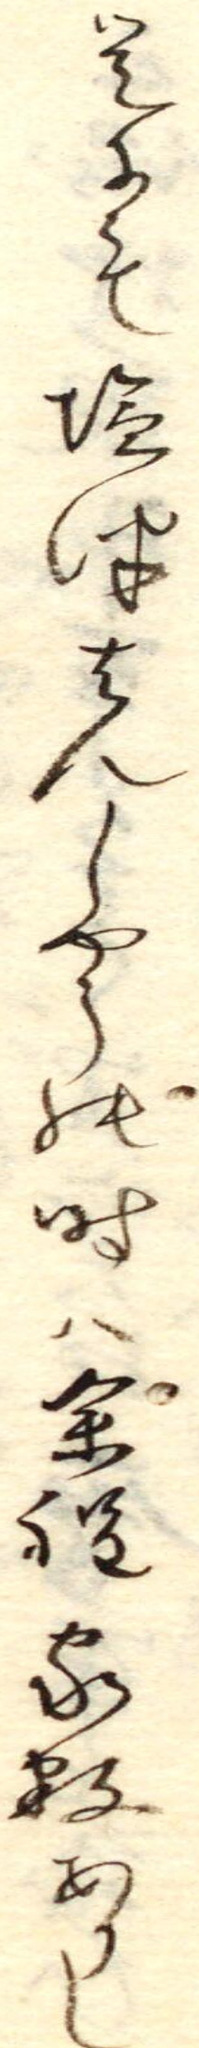是にも塩津はんしやうの時は余程家数ありし
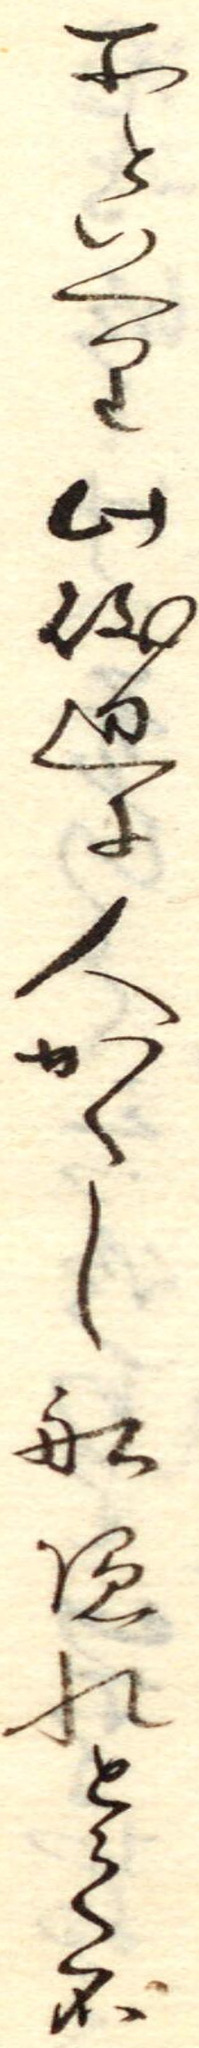所といへり此礒辺に人かくし船隠れとて不
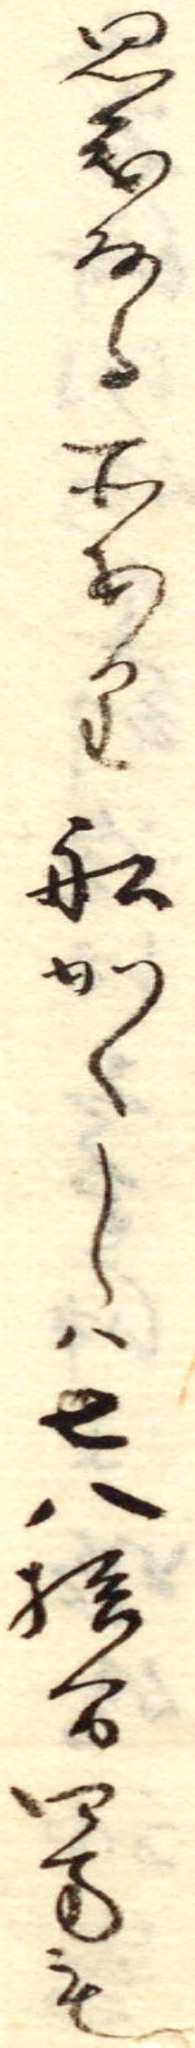思議なる所あり船かくしは七八拾間四方も
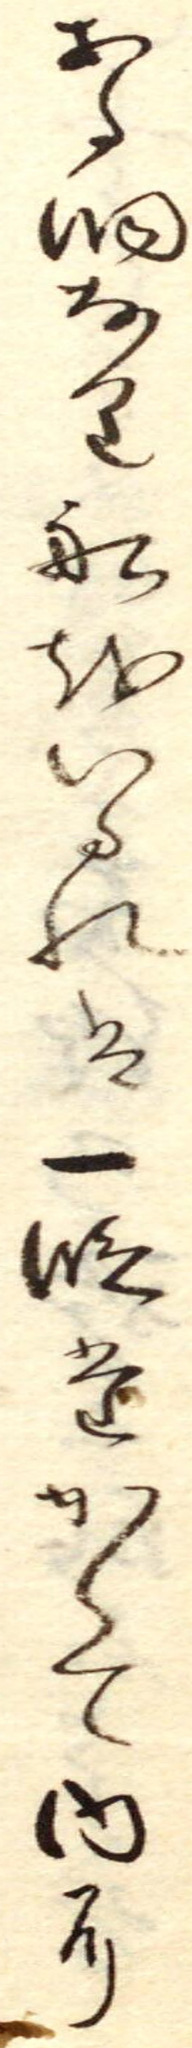ある洞なり船をいるれは一段たかくて内に
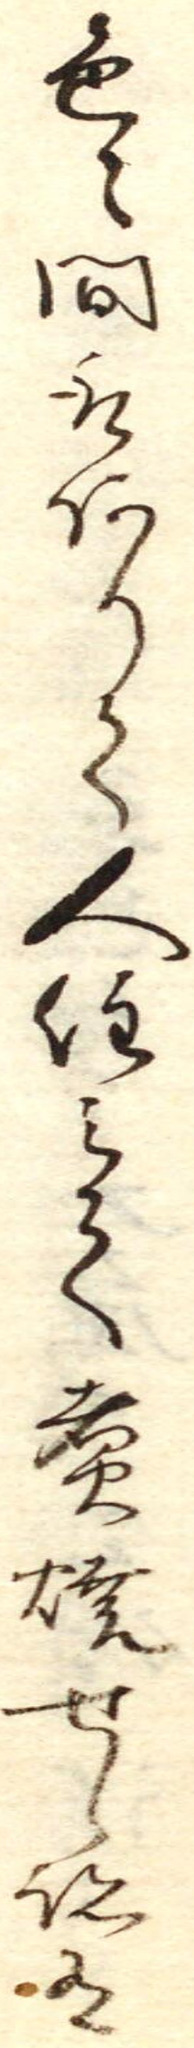色々間取ありて人住みて煮焼せし跡有
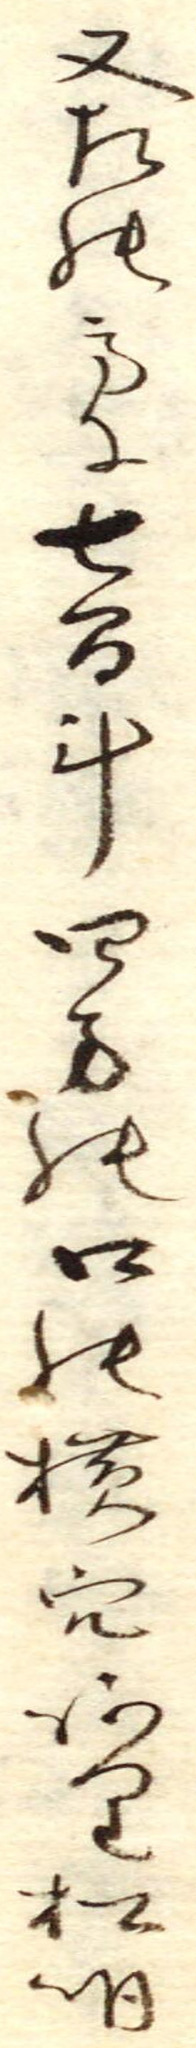又左の方に七間計四方の口の横穴あり松明
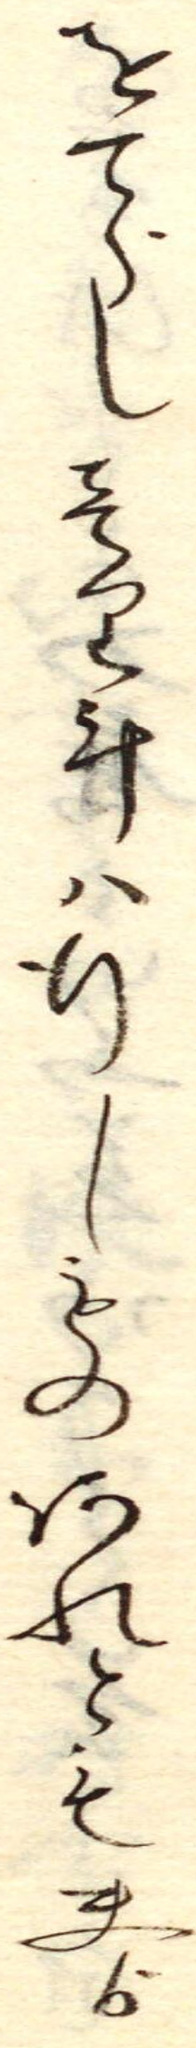をてらし壱里計は行しものあれとも夫ゟ
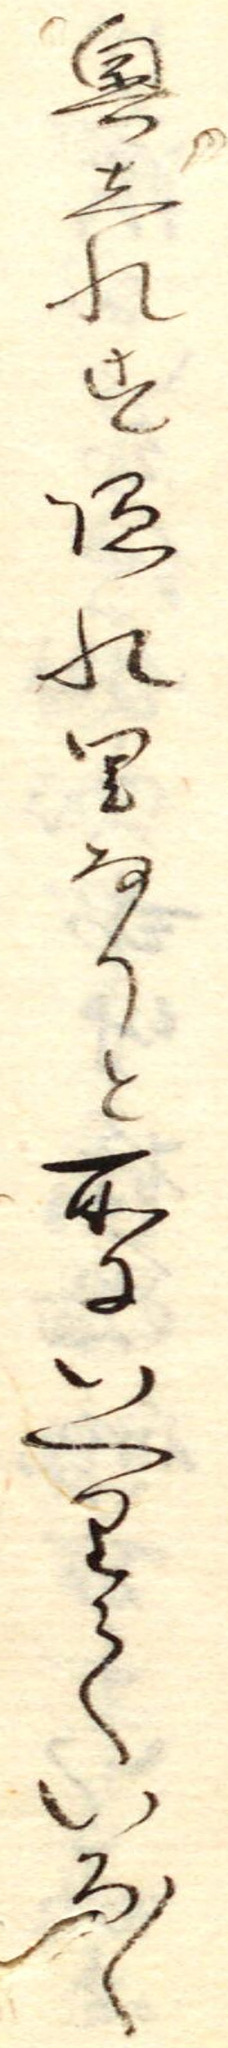奥しれす隠れ里なりと所にいへりていろ〳〵
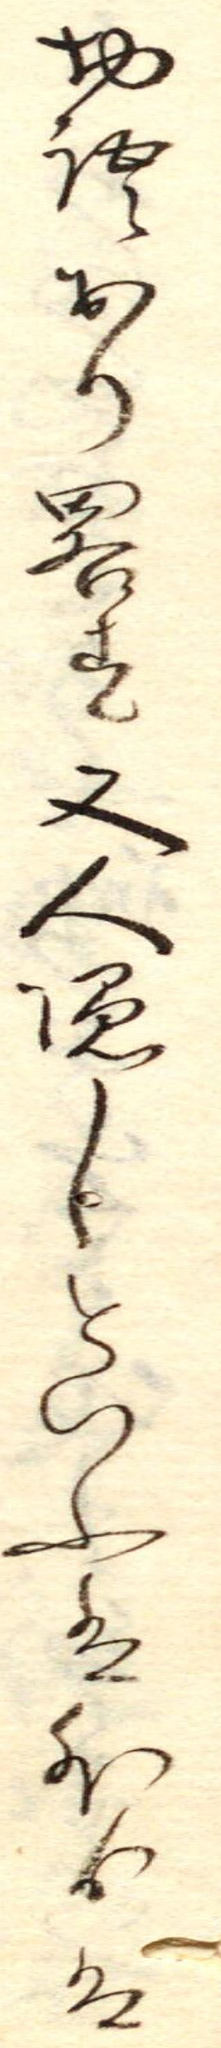物語あり略す又人隠しといふは外ゟは
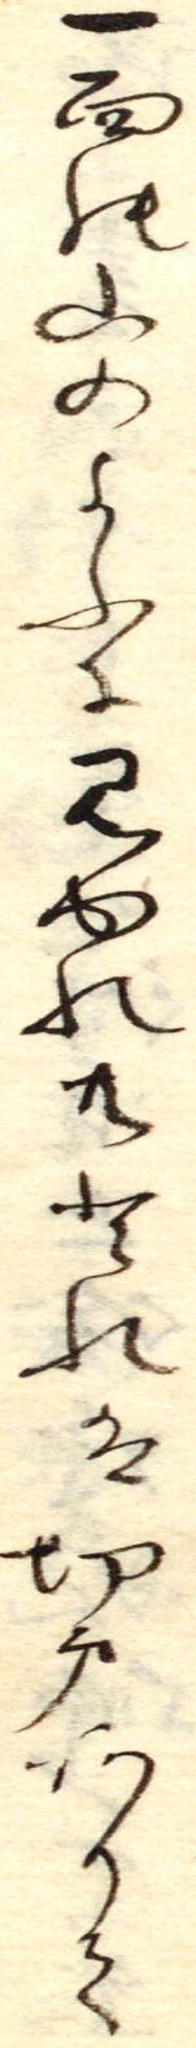一面の山のよふに見ゆれ共とれは切戸ありて
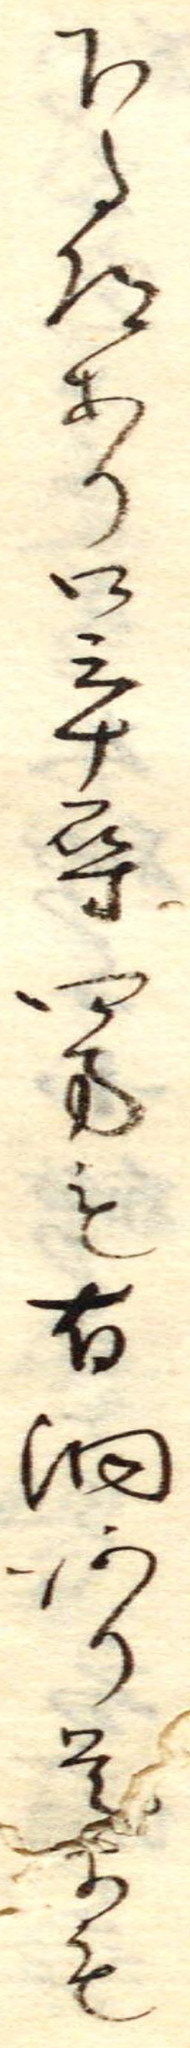下る道あり口三十尋四方も有洞あり是にも
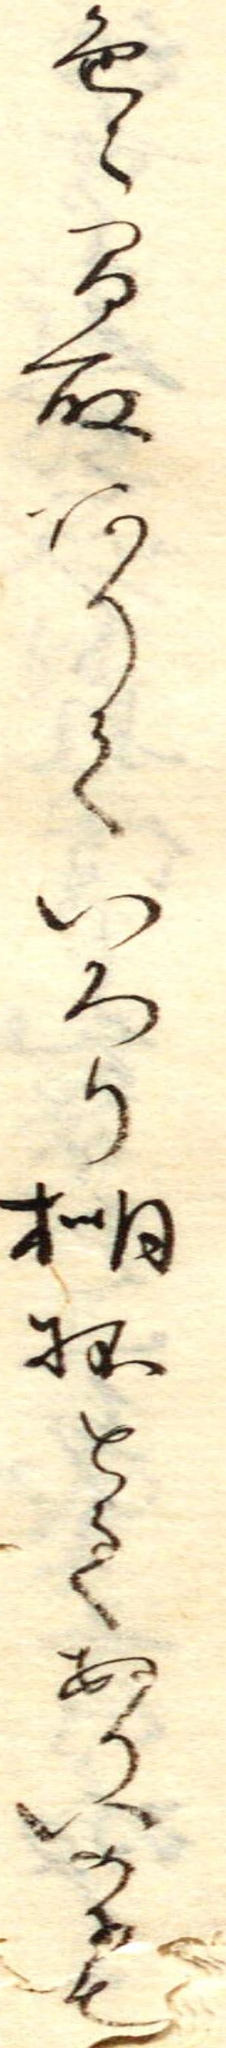色々間取ありていろり棚抔とてありいかにも

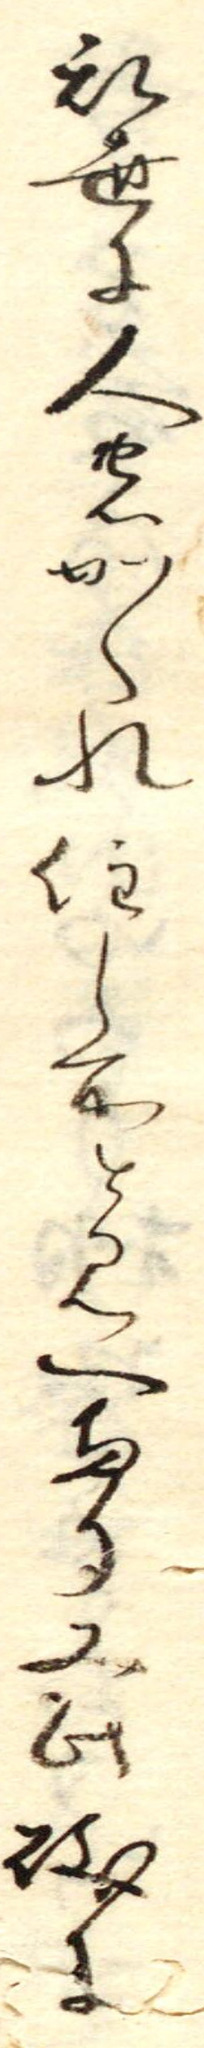乱世に人のかくれ住し所と見へたり又此礒に
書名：能登名跡誌
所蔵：Ishikawa Prefectural Library
